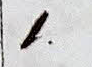1.
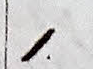1.
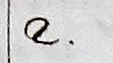2.
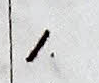1.
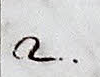2.
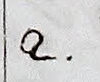2.
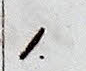1.
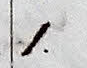1.
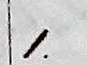1.
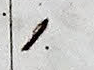1.
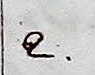2.
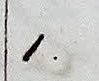1.
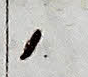1.
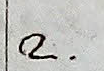2.
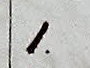1.
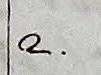2.
